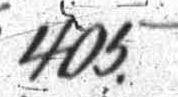405.
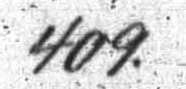409.
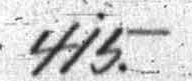445.
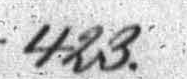423.
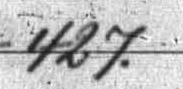427.
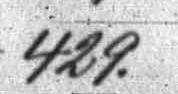429.
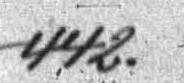442.
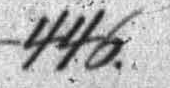446.
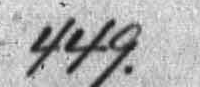449.
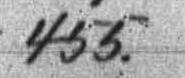455.
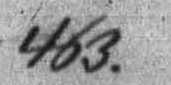463.
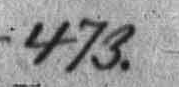473.
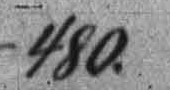480.
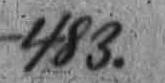483.
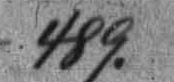489.
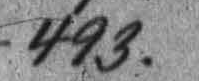493.
